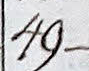49
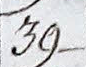39
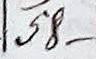58
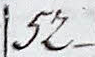52
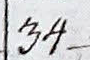34
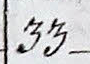33
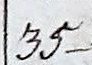35
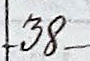38
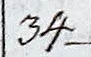34
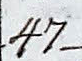47
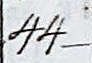44
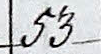53
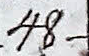48
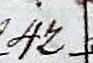42
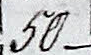50
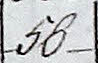56
